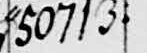50713
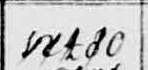12480
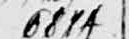6814
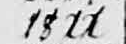1822
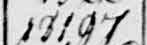17197
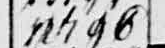11796
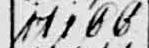17166
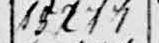15277
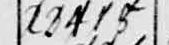23415
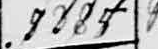5385
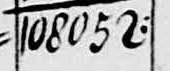108052
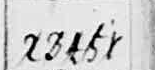23451
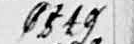6549
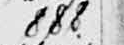888
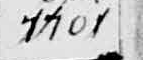7701
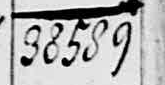38589
